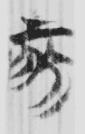所
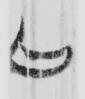㠯（以）
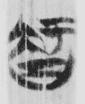智
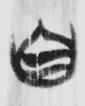自
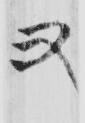又
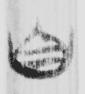自
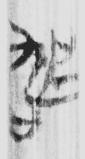喪
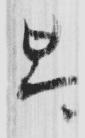也
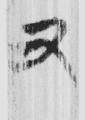又
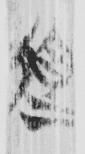道
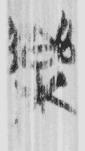樂
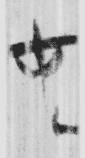才
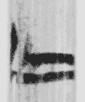亡
